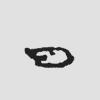四
